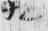九
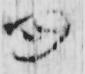月
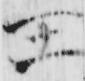壬
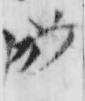戌
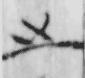之
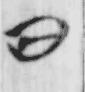日
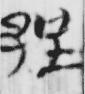郢
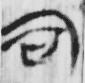司
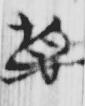惪
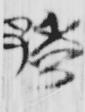○（秀）
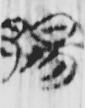陽
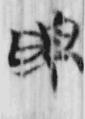受
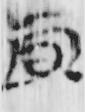○（期）
